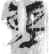東
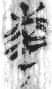南
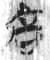高
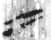二
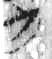方
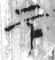下
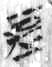是
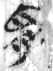{胃刀}（謂）
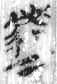虛
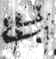井
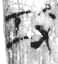攻
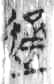通
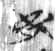𡚦
